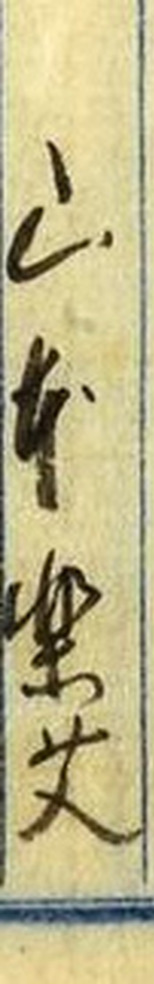山本楽艾
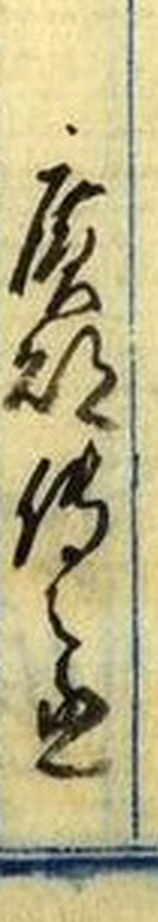広部伝之丞

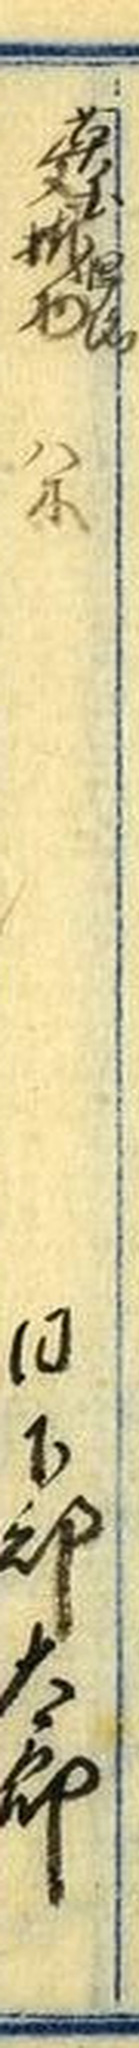文掛物八木日下部太郎
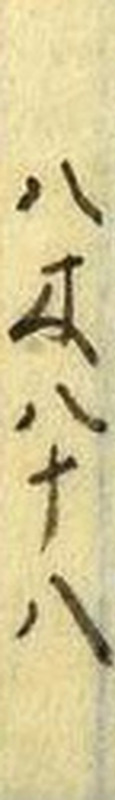八木八十八

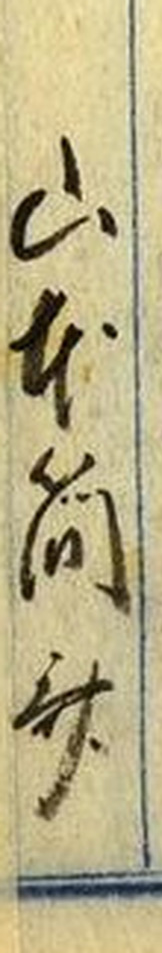山本簡斎
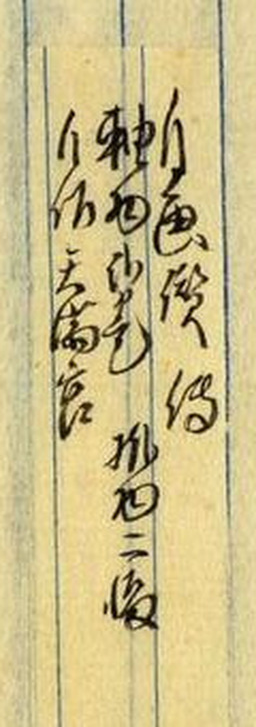軸物弐巻掛物二幅
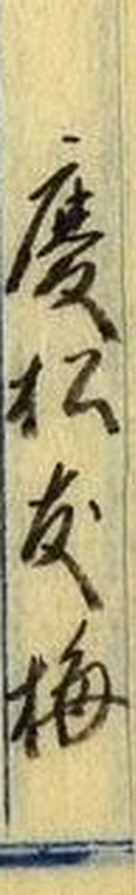慶松友梅
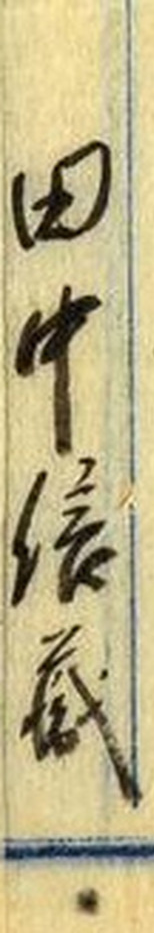田中信蔵
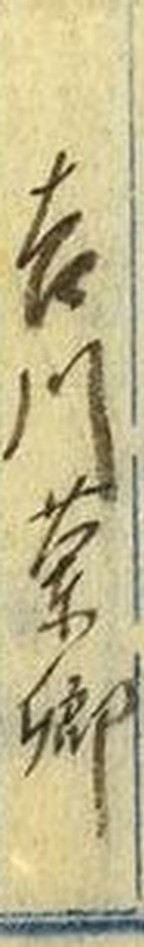吉川蘭卿
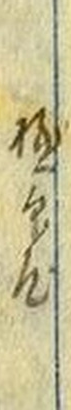極印屋
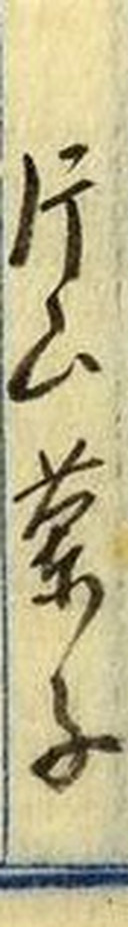片山蘭子

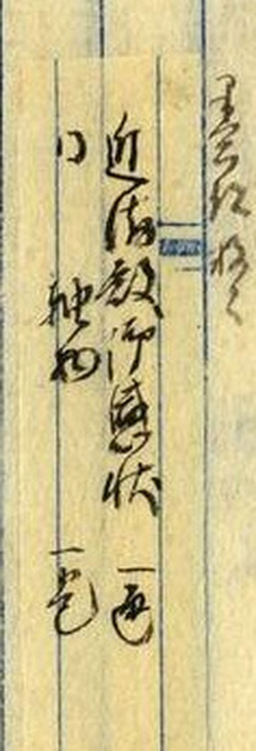「近衛殿御感状一通
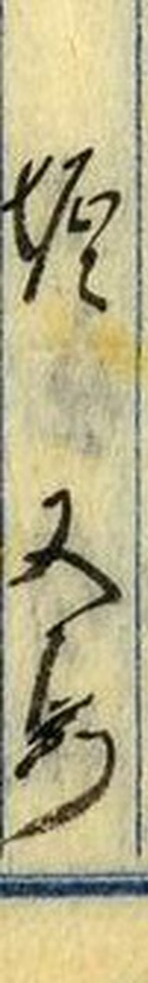堀又右衛門
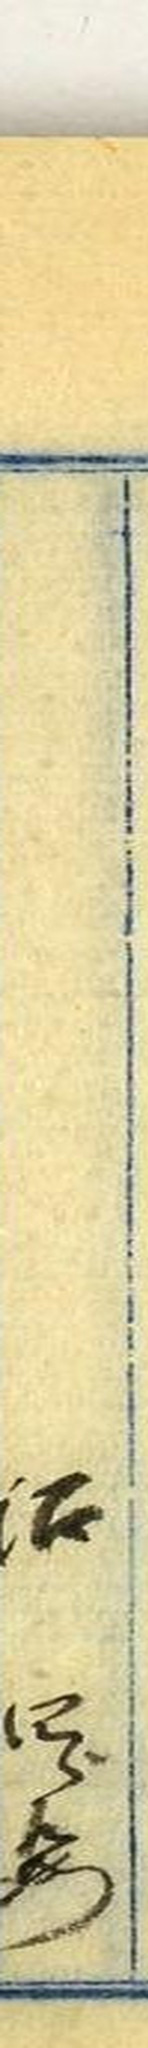沼四郎左衛門
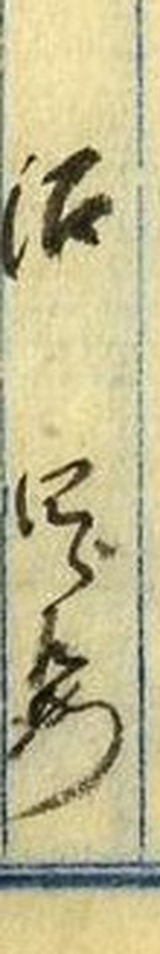沼四郎左衛門

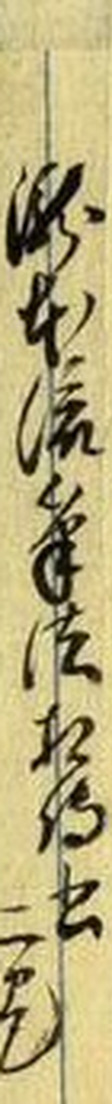「瀧本流筆法相伝書
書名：温古集 四巻
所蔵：福井県文書館 Fukui Prefectural Archives
